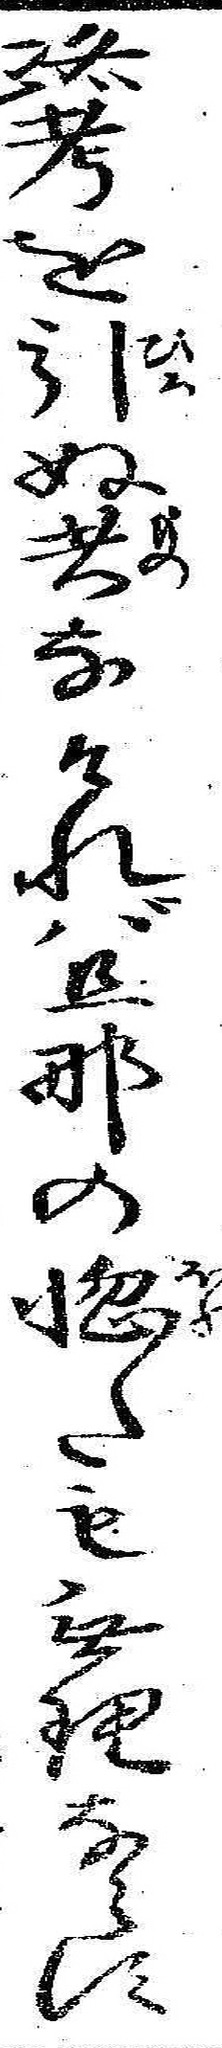路考を引ぬ者なければ且那の惚たも無理ならす
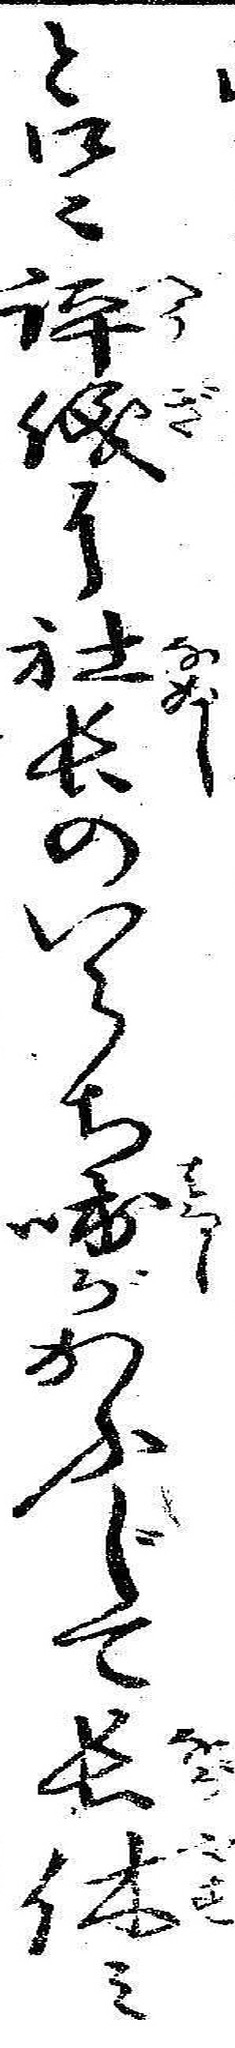と口々評儀に社長のいらち咄がかふじて長休み
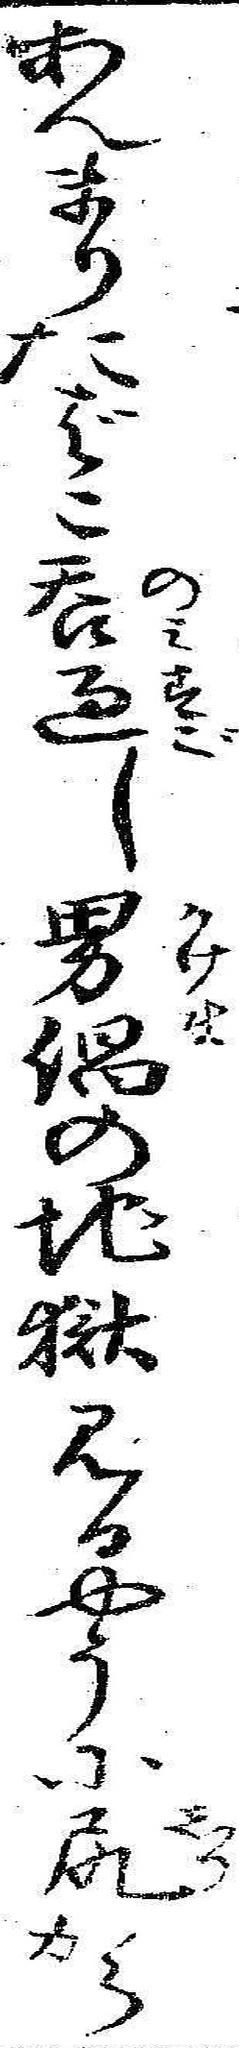あんまりたばこ呑過し男倡の地獄見るやうに尻から
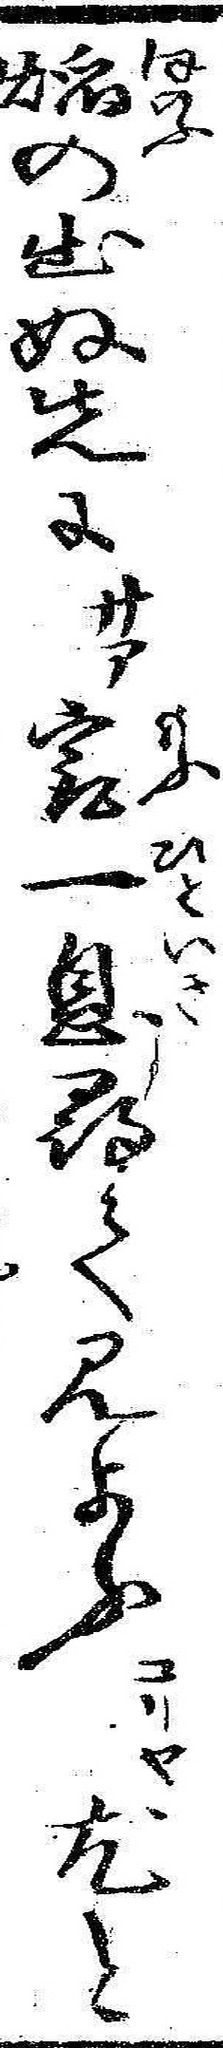焔出ぬ先に最一息尋て見よふ尤と
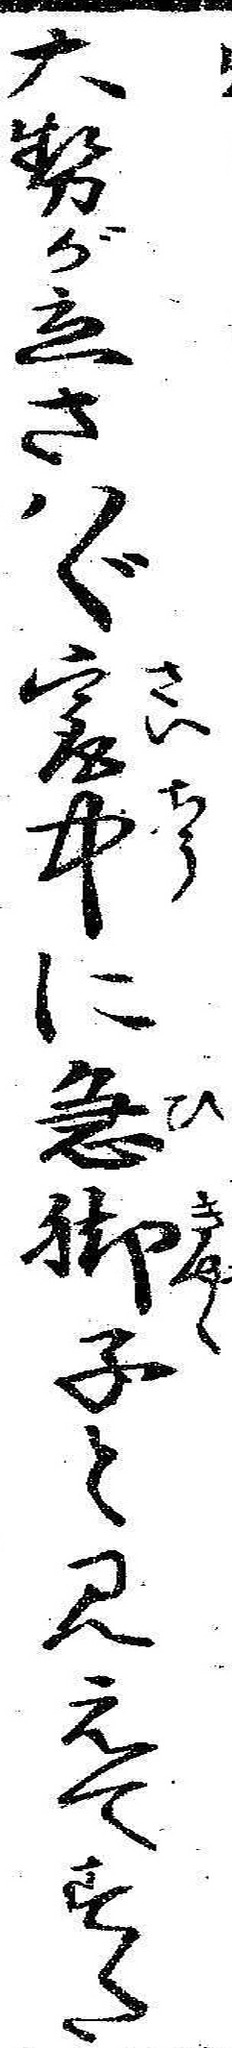大勢が立さはぐ最中に急脚子と見えてすた
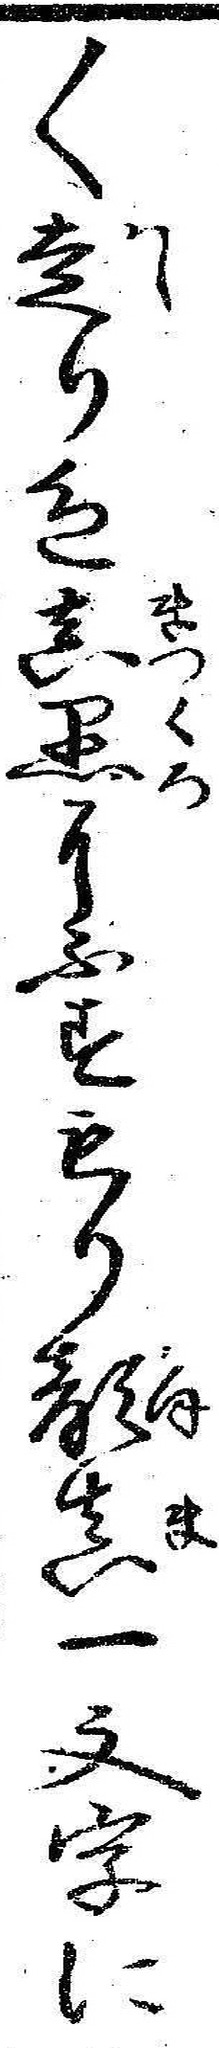〱走り色真黒にふすもり顔真一文字に
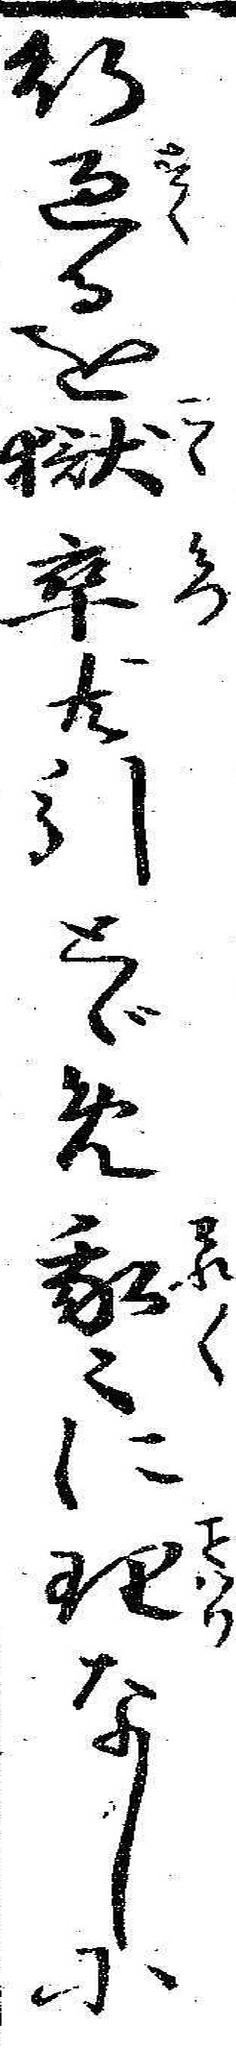行過るを獄卒共引とゞめ我々に理なしに

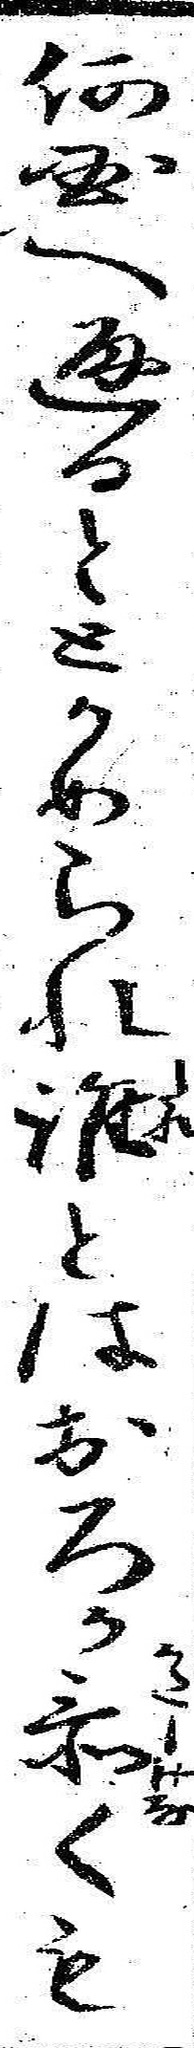何国へ通るととかめられ誰とはおろか忝くも
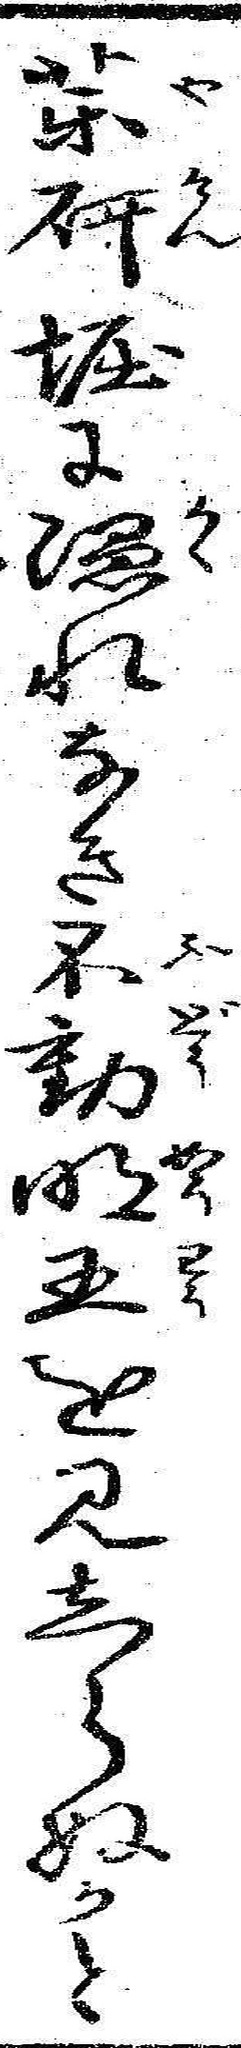薬研堀に隠れなき不動明王を見しらぬかと
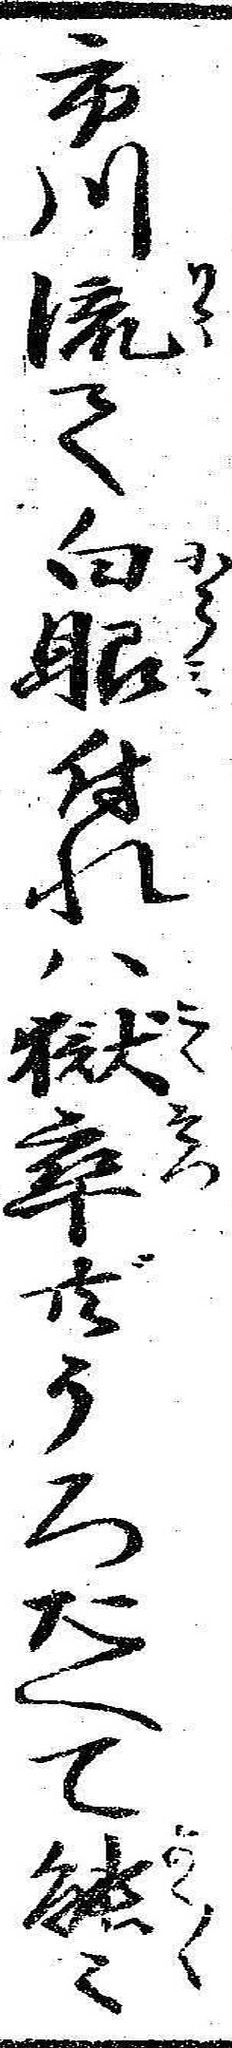市川流て白眼付れは獄卒共うろたへて能々
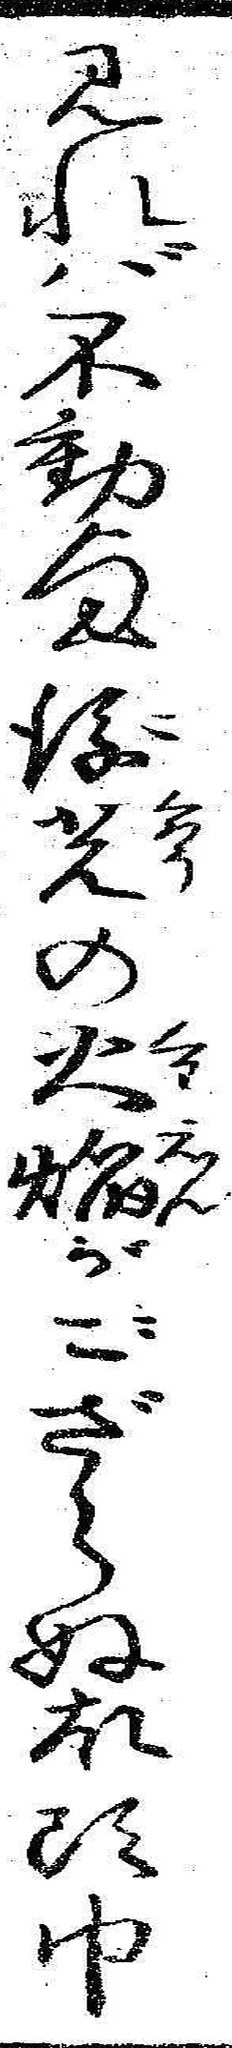見れば不動様後光の火焰がござらぬ故頭巾
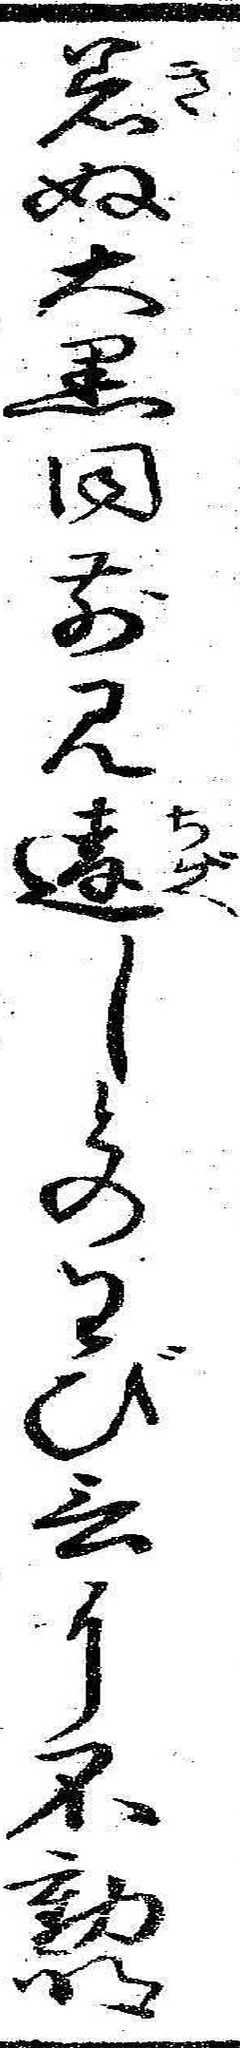着ぬ大黒同前見違しとのわび言に不動明
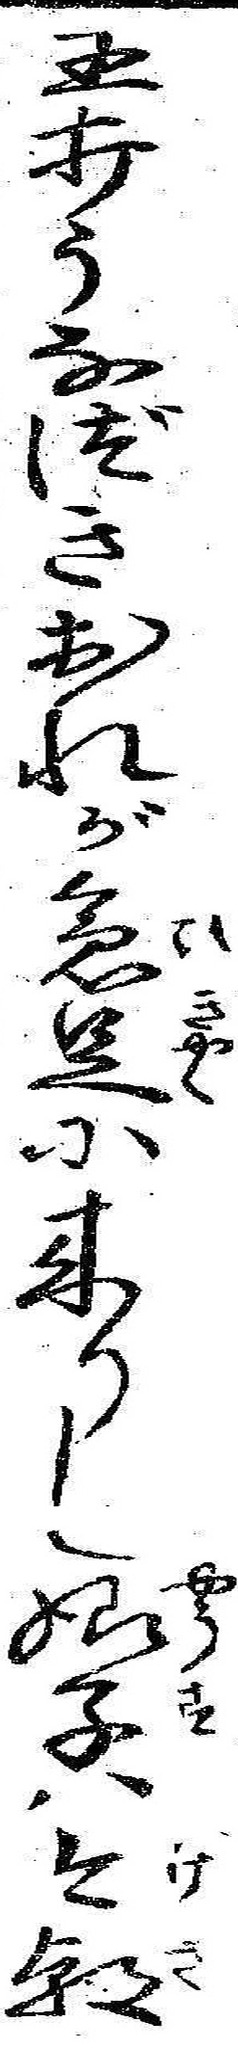王打うなづきおれが急足に来りし様子は今朝
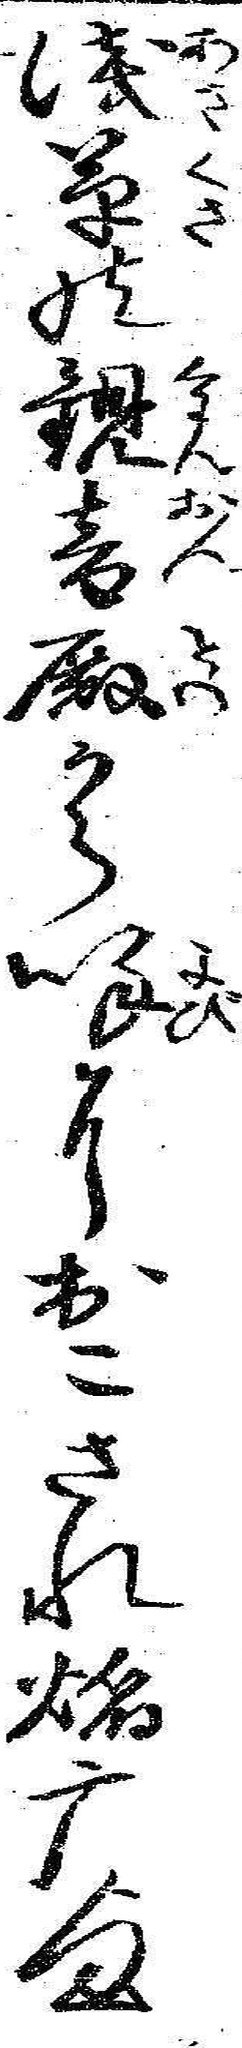浅草の観音殿から呼におこされ焔魔様
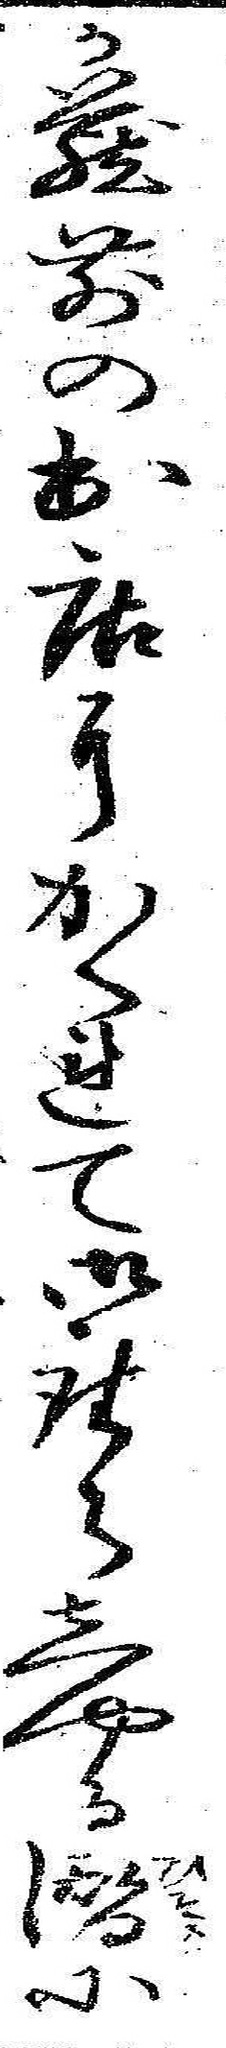か蔵前の出店にかくれて御座らしやる潜に
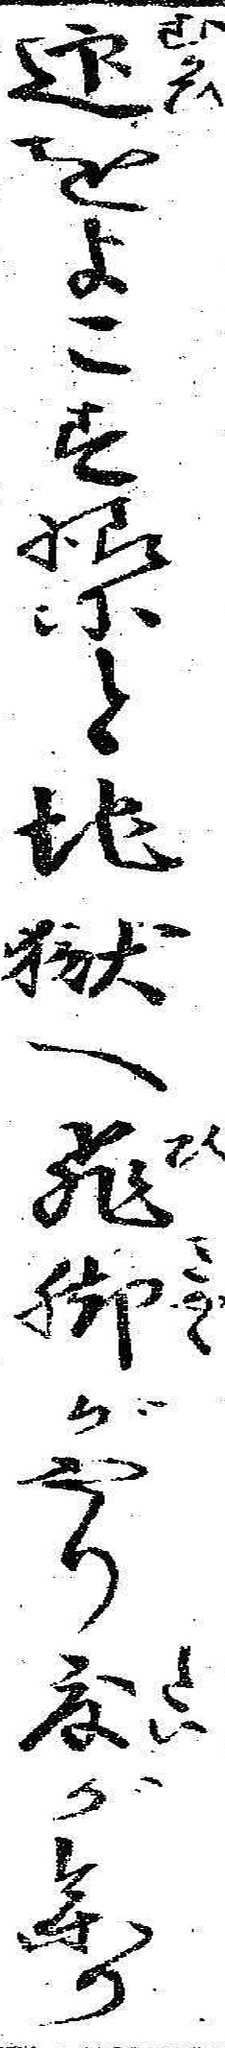迎をよこす様にと地獄へ飛脚がやり度が参り
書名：根無草後編
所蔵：国文学研究資料館
